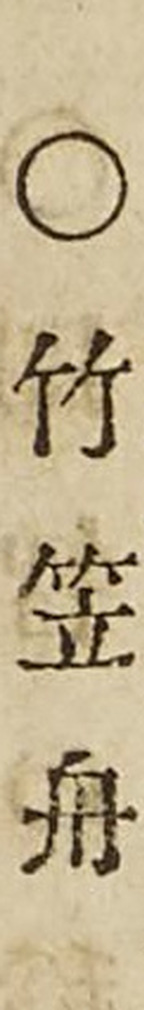○竹笠舟
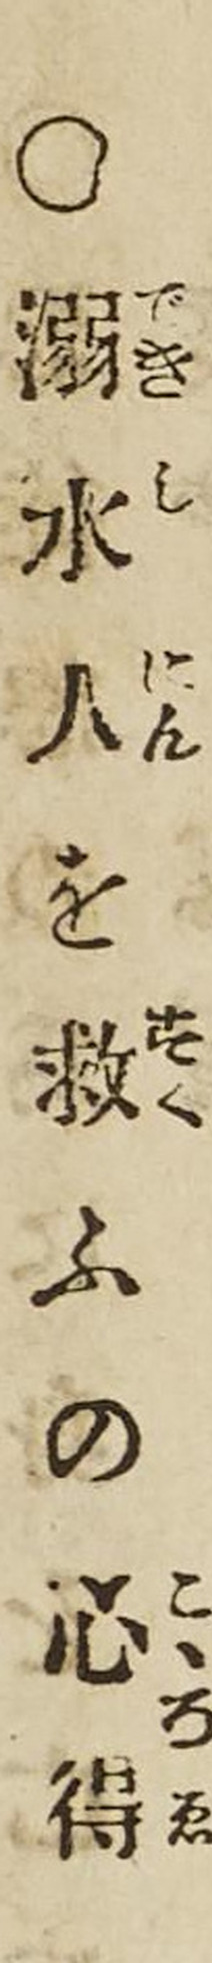○溺水人を救ふの心得

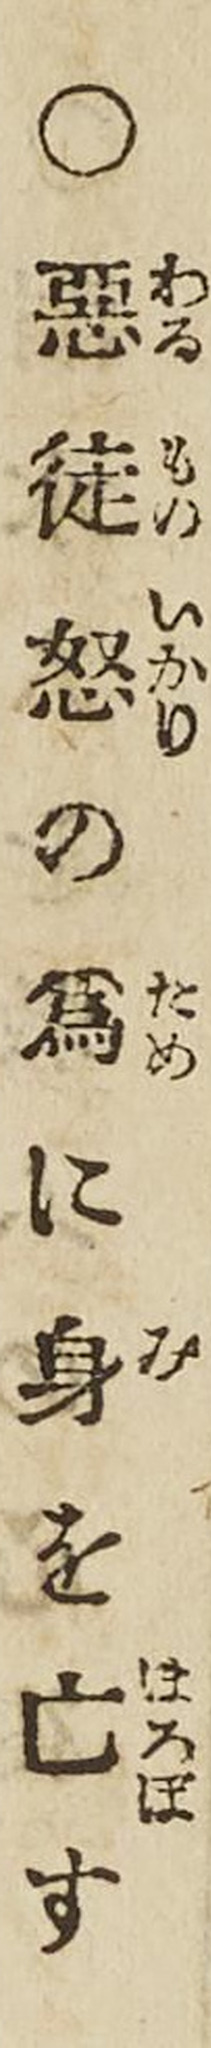○悪徒怒の為に身を亡す
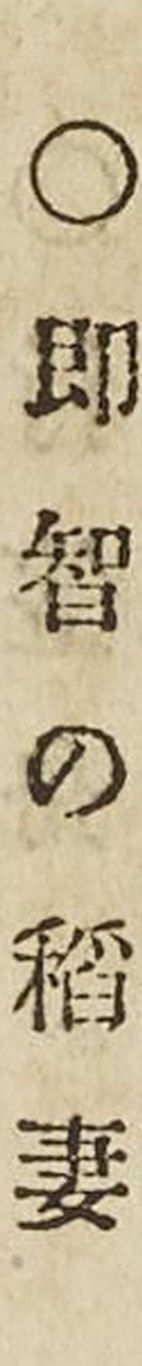○即智の稲妻
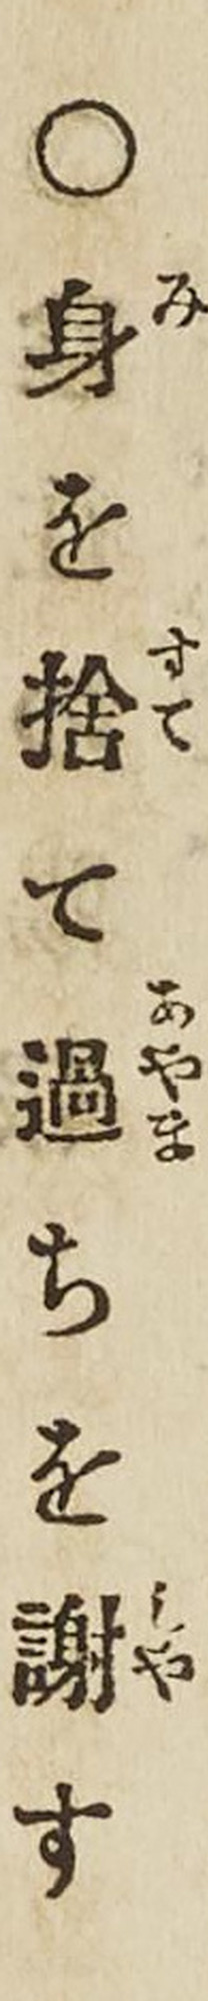○身を捨て過ちを謝す
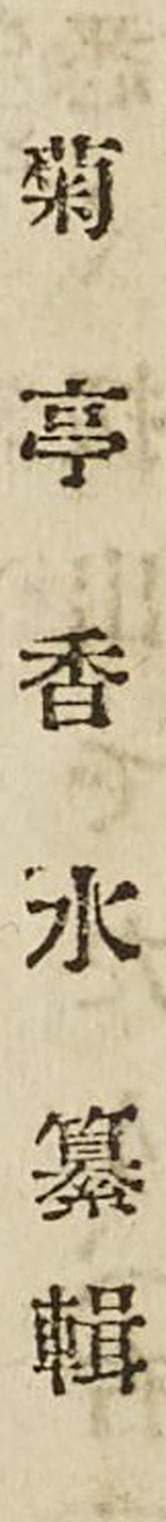菊亭香水纂輯
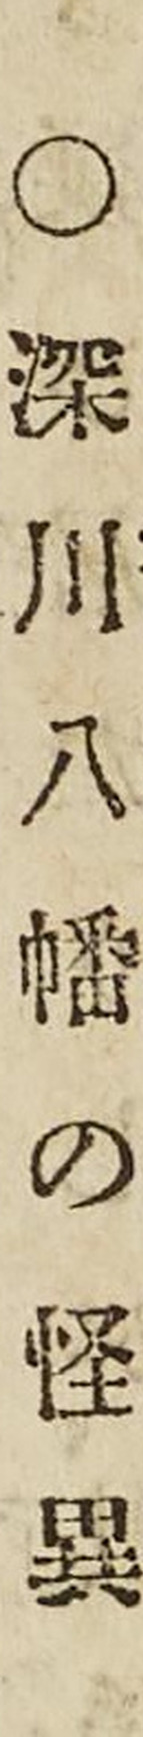○深川八幡の怪異
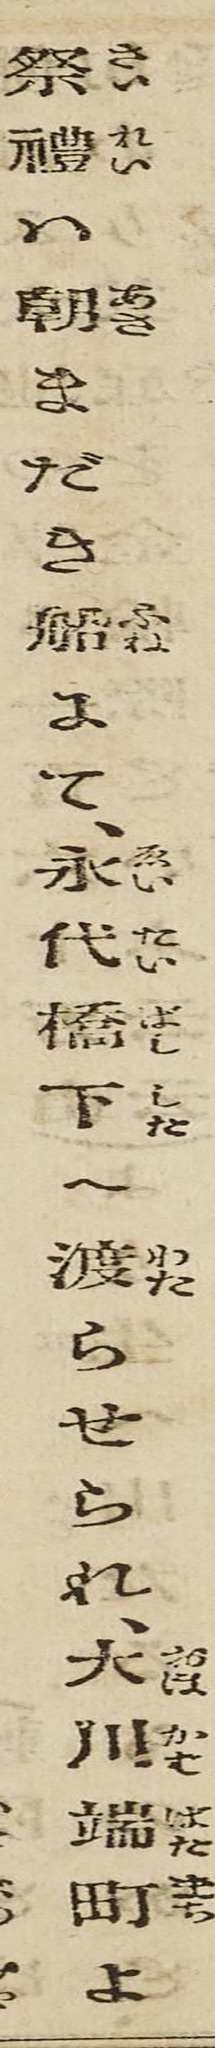祭礼は朝まだき船にて、永代橋下へ渡らせられ、大川端町よ
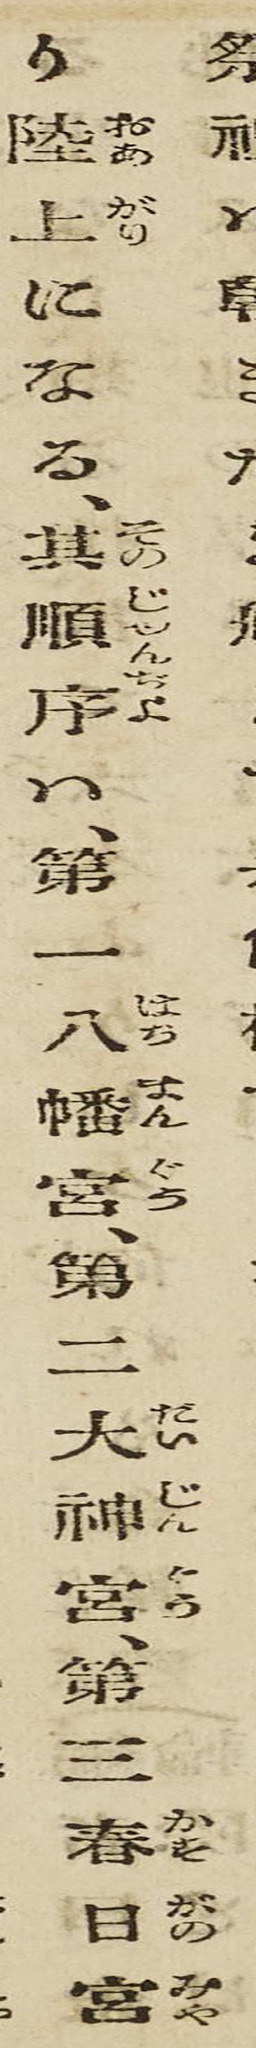り陸上になる、其順序は、第一八幡宮、第二大神宮、第三春日宮
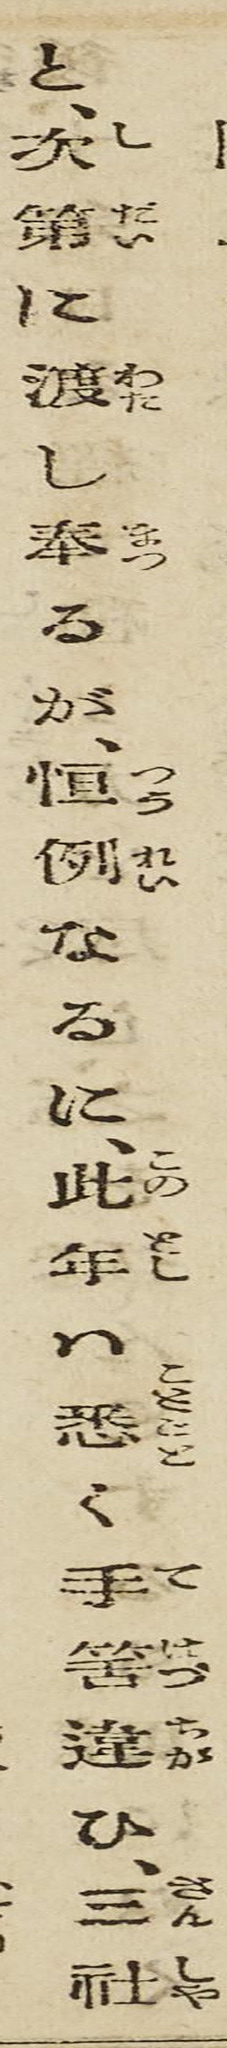と、次第に渡し奉るが、恒例なるに、此年は悉く手筈違ひ、三社
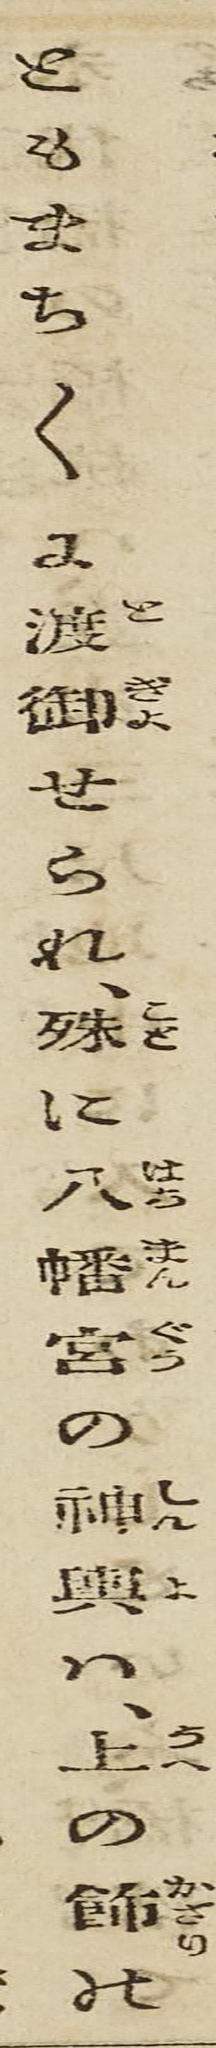ともまち〳〵に渡御せられ、殊に八幡宮の神輿は、上の飾の
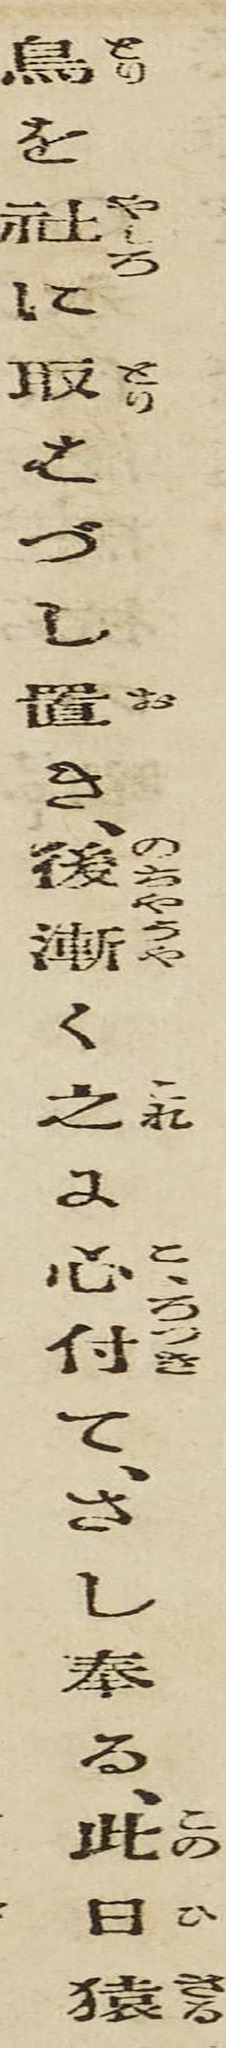鳥を社に取はづし置き、後漸く之に心付て、さし奉る、此日猿
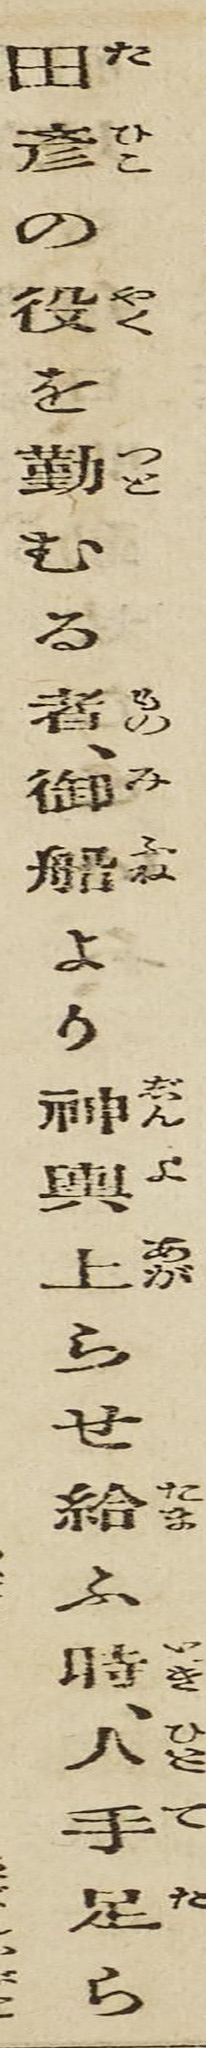田彦の役を勤むる者、御船より神輿上らせ給ふ時、人手足ら
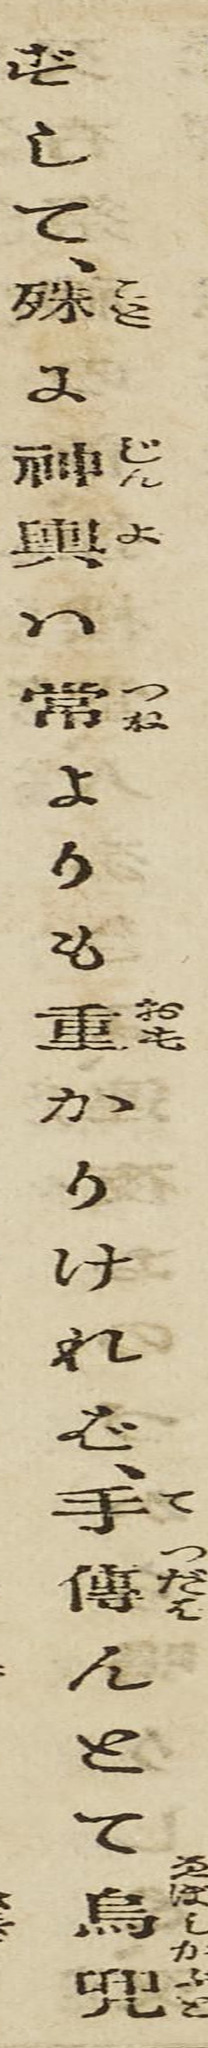ずして、殊に神輿は常よりも重かりければ、手伝んとて烏兜
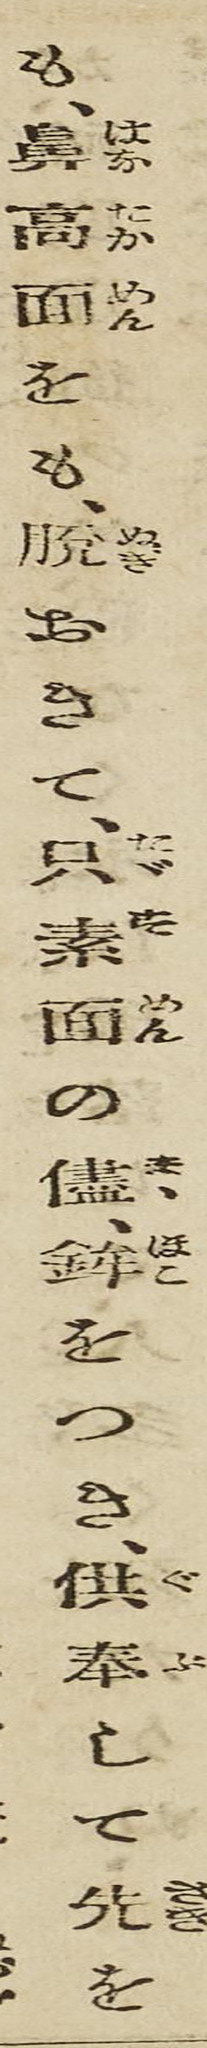も、鼻高面をも、脱おきて、只素面の侭、鉾をつき、供奉して先を
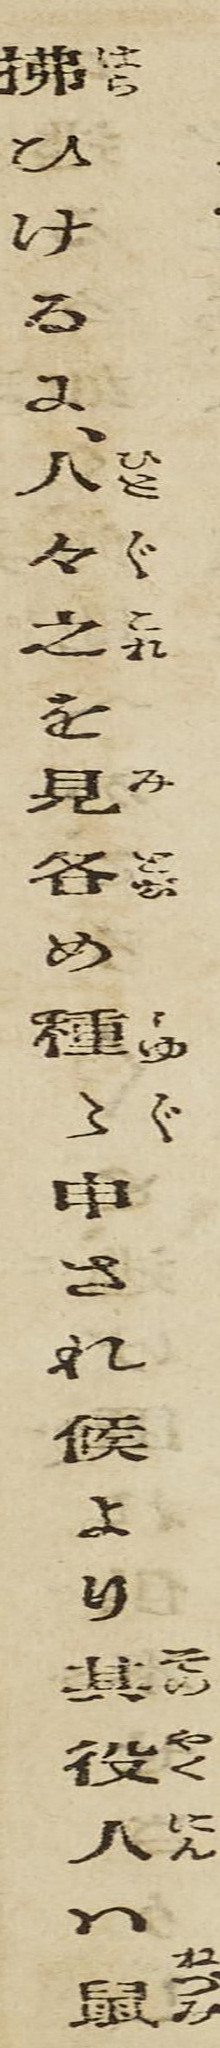払ひけるに、人々之を見咎め種〻申され候より其役人は鼠
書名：永代惨話　文化の夢　全
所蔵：東京大学地震研究所図書室 Earthquake Research Institute Library, The University of Tokyo, JAPAN
